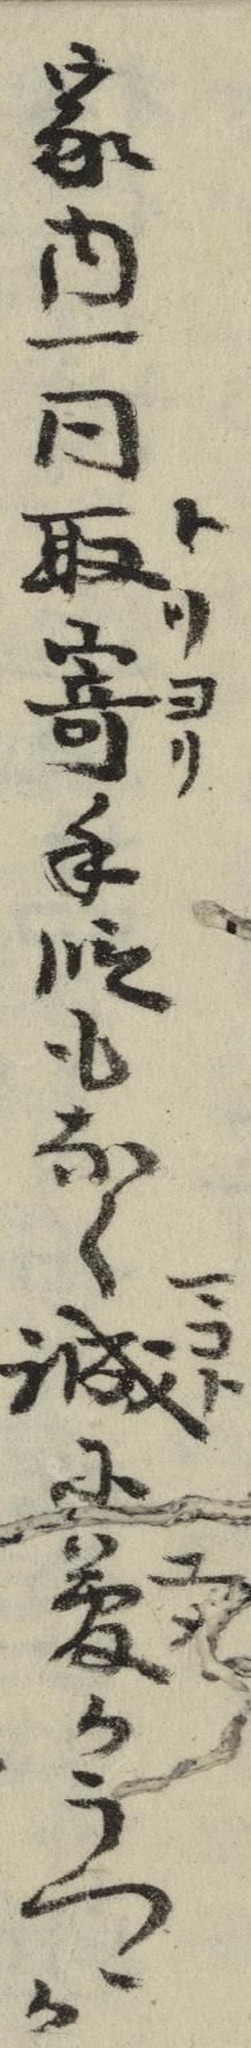家内一同取寄手段もなく誠に夢かうつゝか
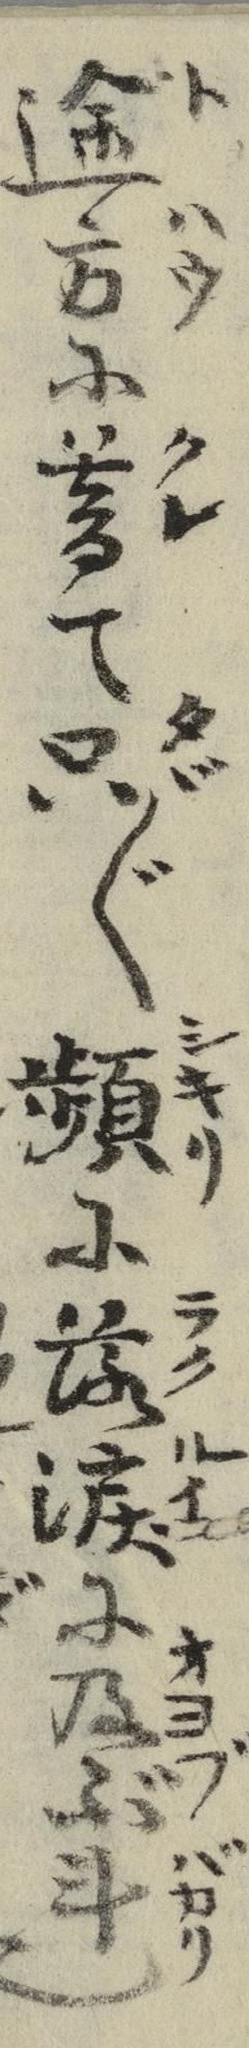途方に暮て只〴〵頻に落涙に及ぶ計也
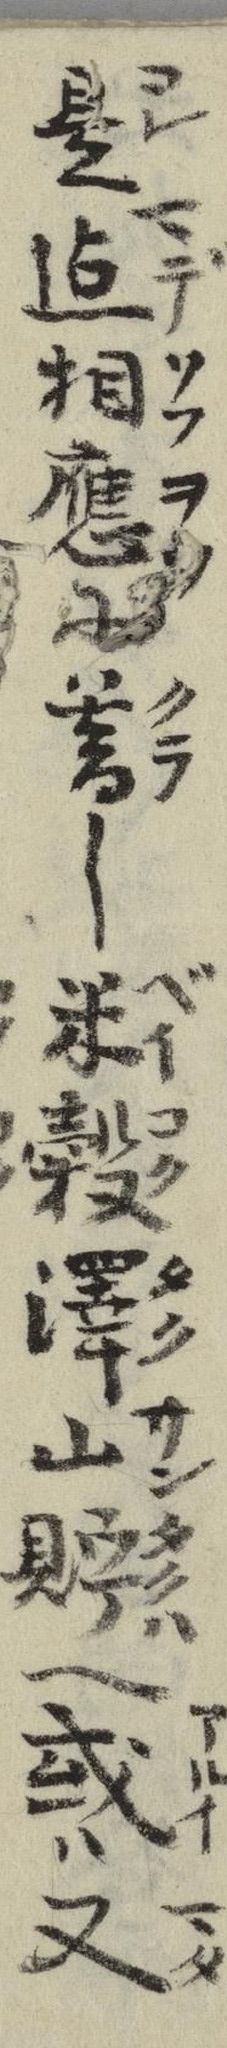是迄相応に暮し米穀澤山貯へ或ハ又
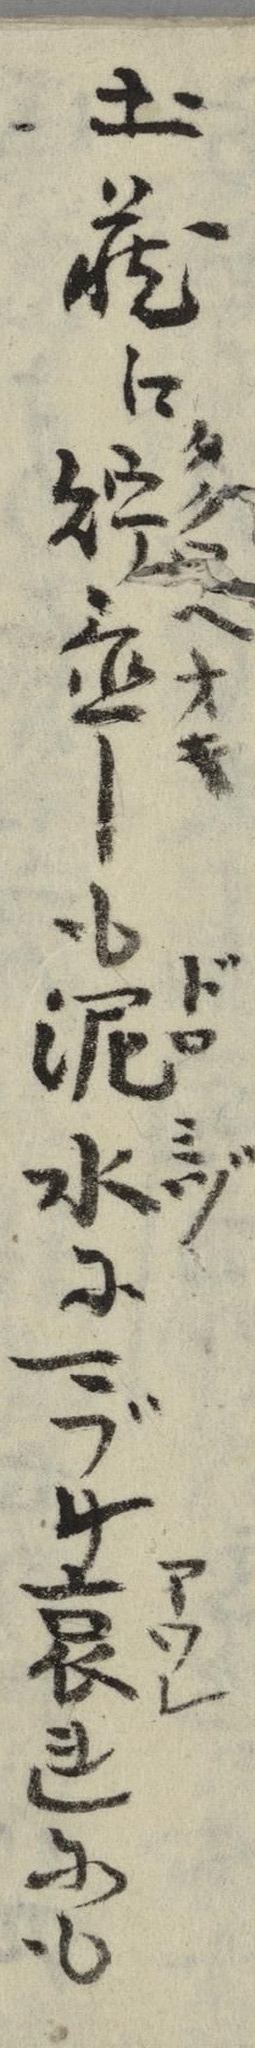土蔵江貯置しも泥水にマブチ哀れにも

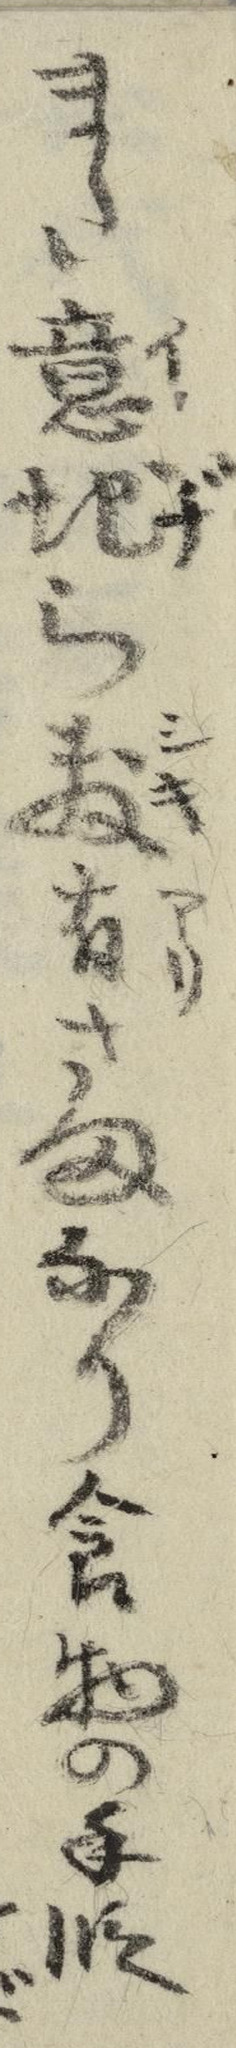また意地ら敷有さまなり食物の手段ナド
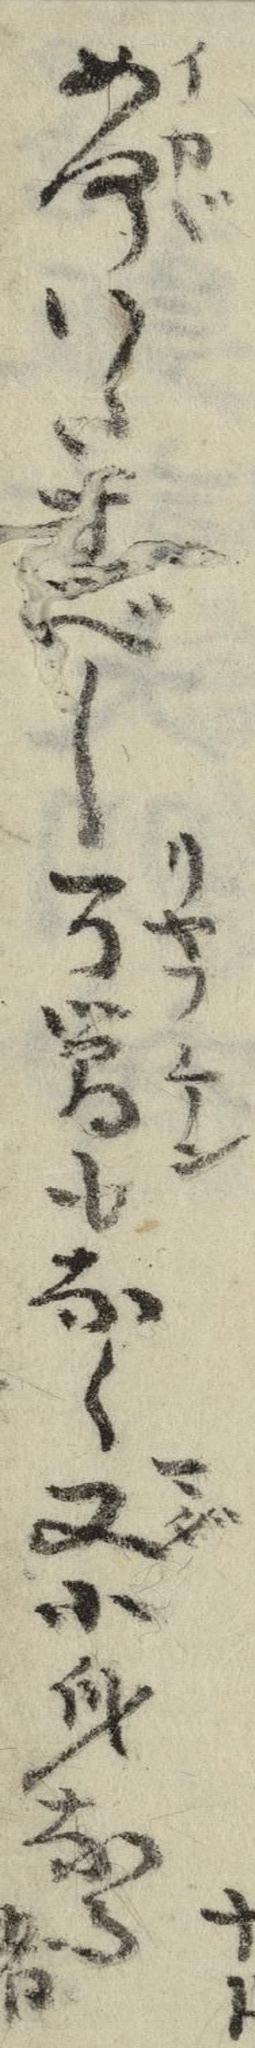如何いたすべし了簡もなく又小身なる者
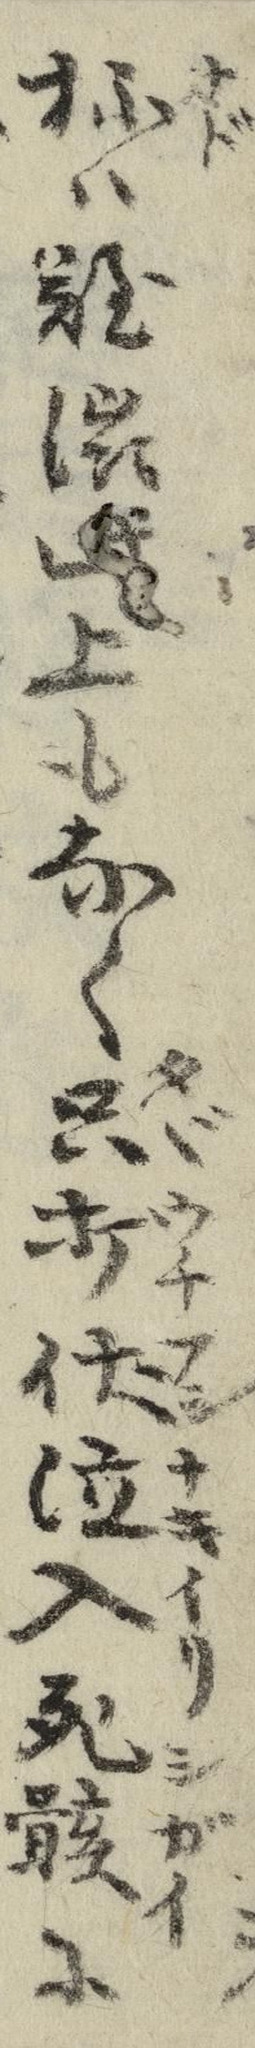抔ハ難渋此上もなく只打伏泣入死骸に
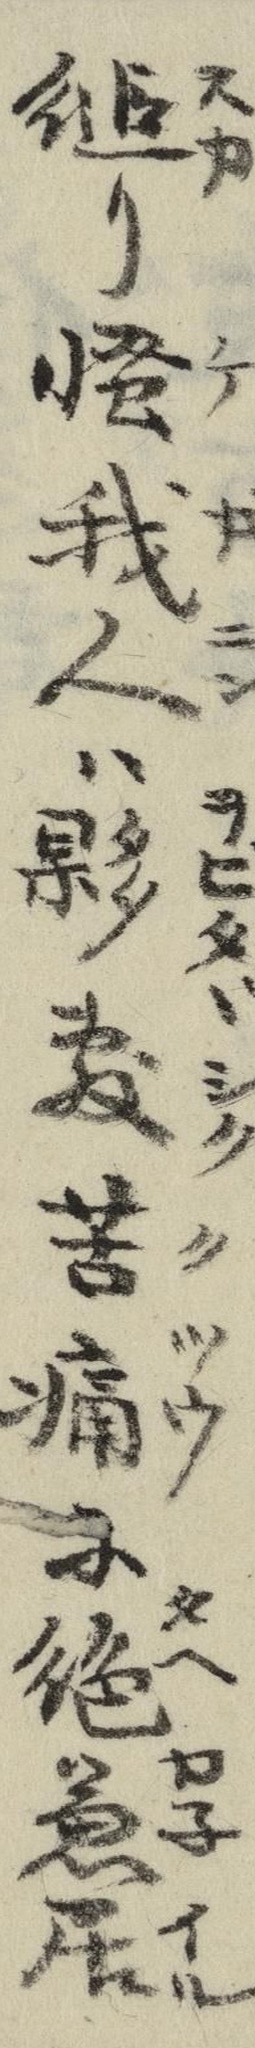縋り怪我人ハ夥敷苦痛に絶兼居
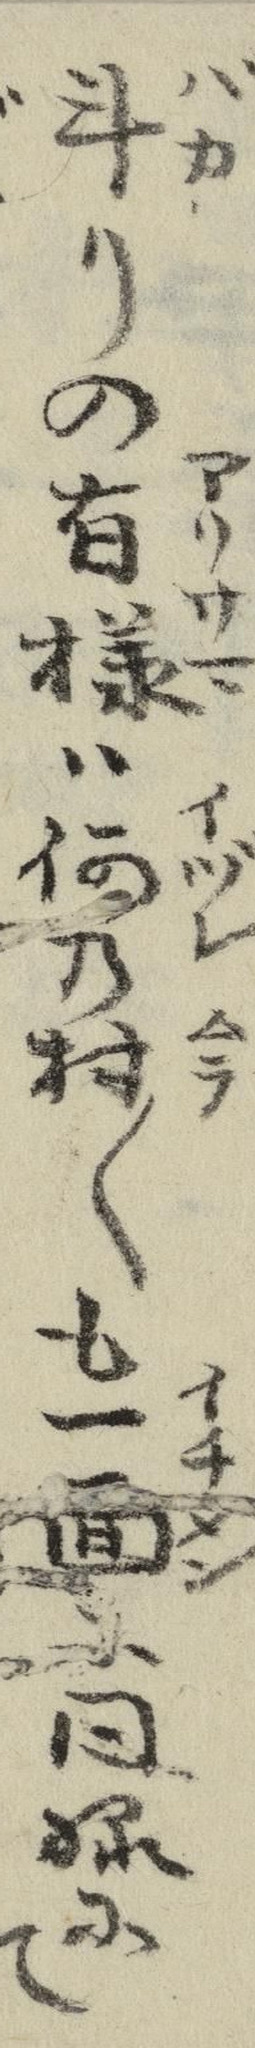計りの有様ハ何の村〳〵も一面に同様にて
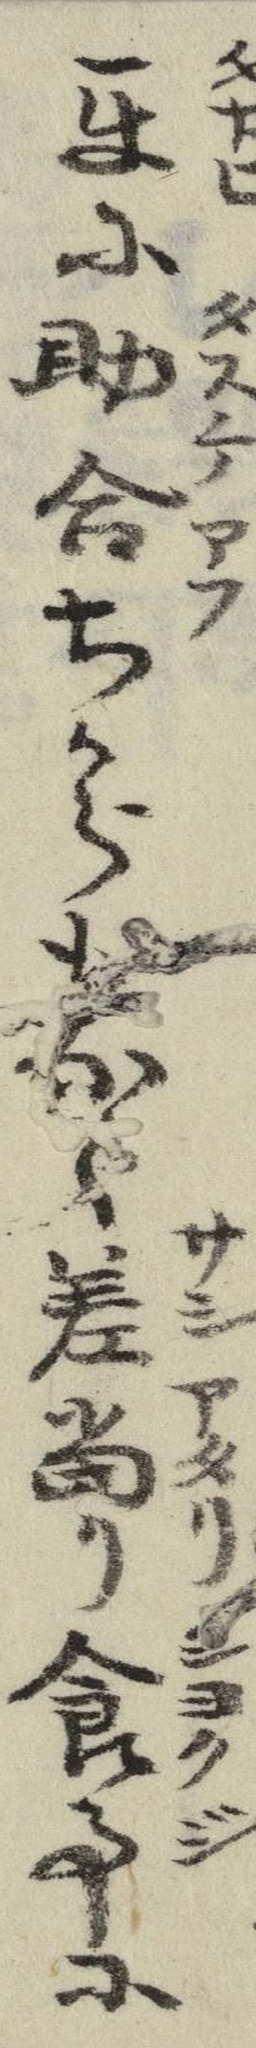互に助合ちからもなく差当り食事に
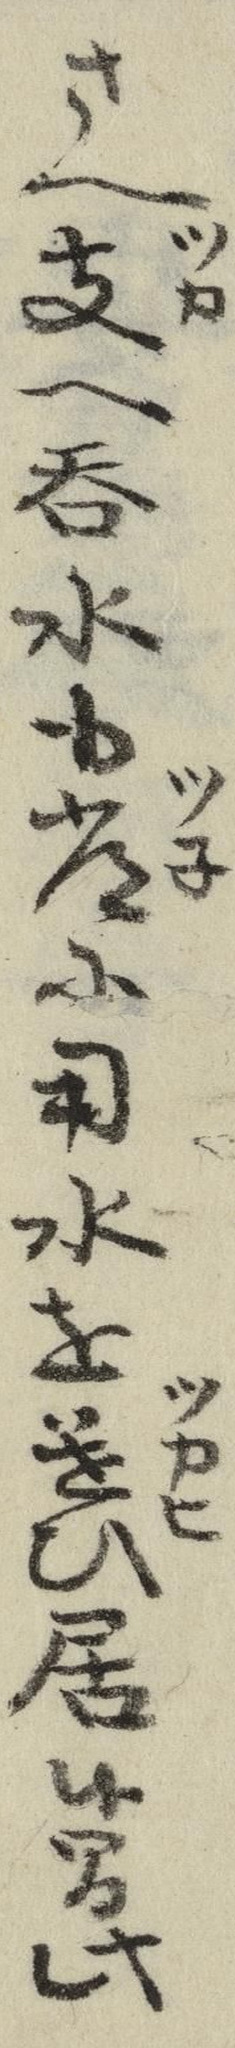さへ支へ呑水も常に用水を遣ひ居候間此
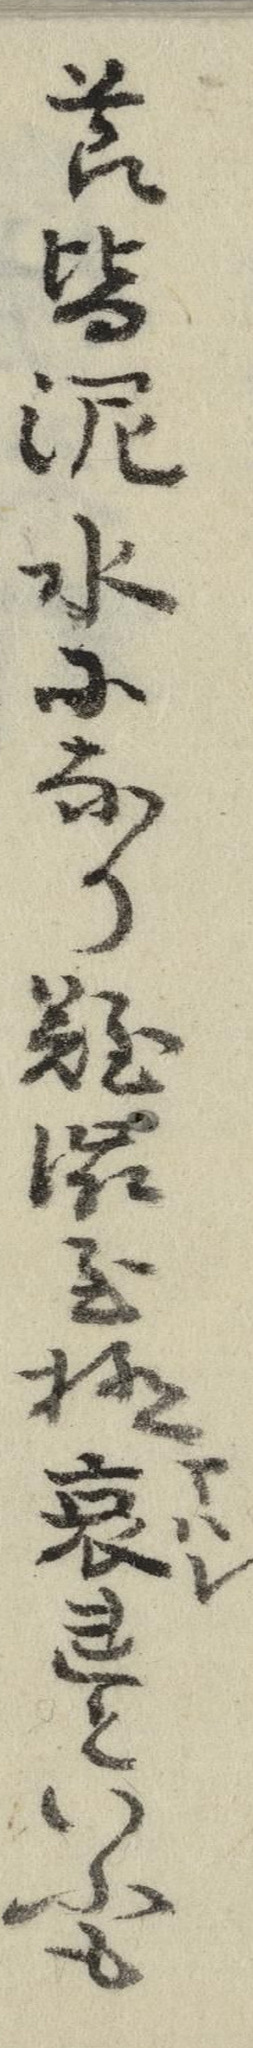節皆泥水になり難渋至極哀れといふも
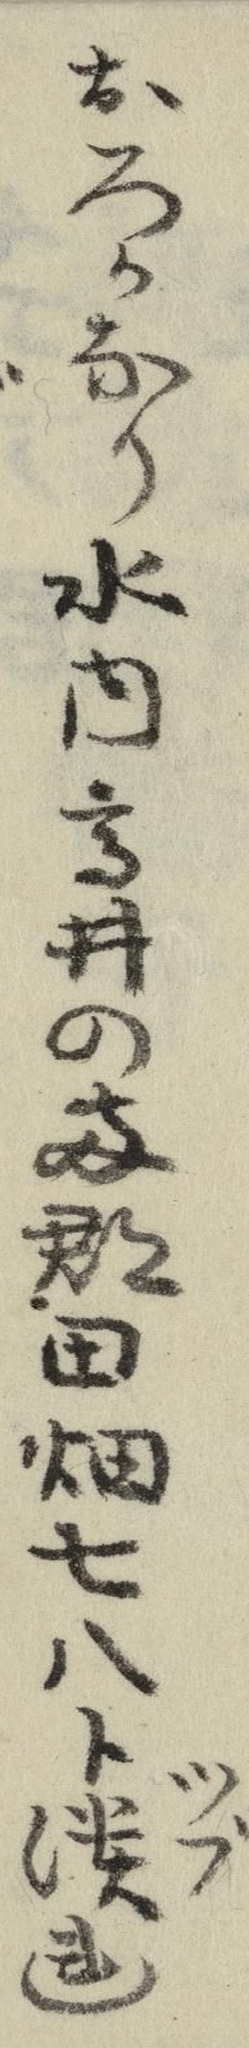おろかなり水内高井の両郡田畑七八分潰れ
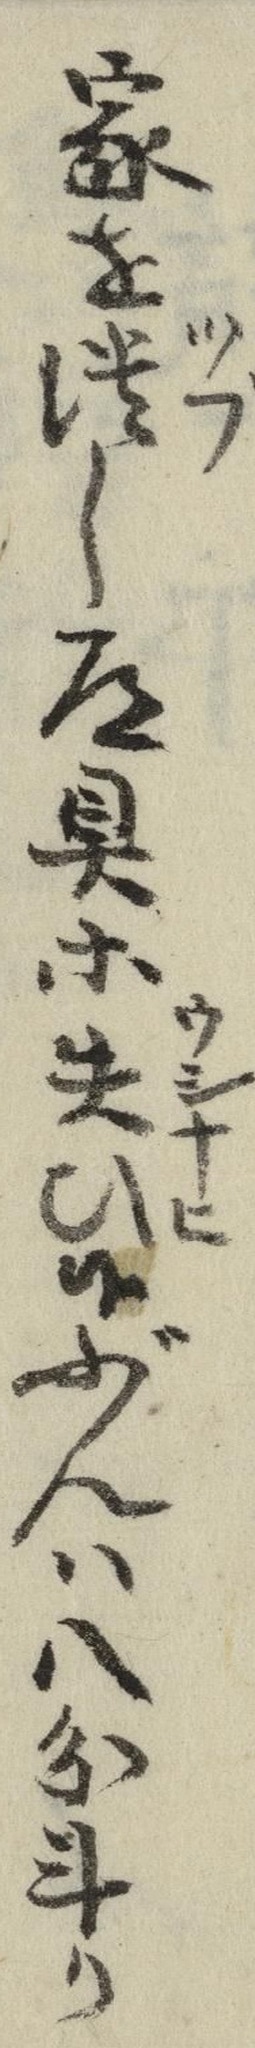家を潰し道具等失失ひ候ぶんハ八分計り
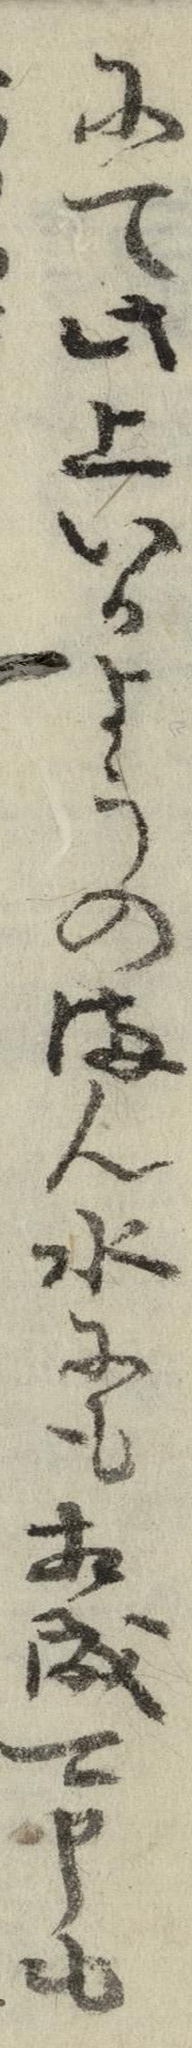にて此上いかようのまん水にも相成可申も
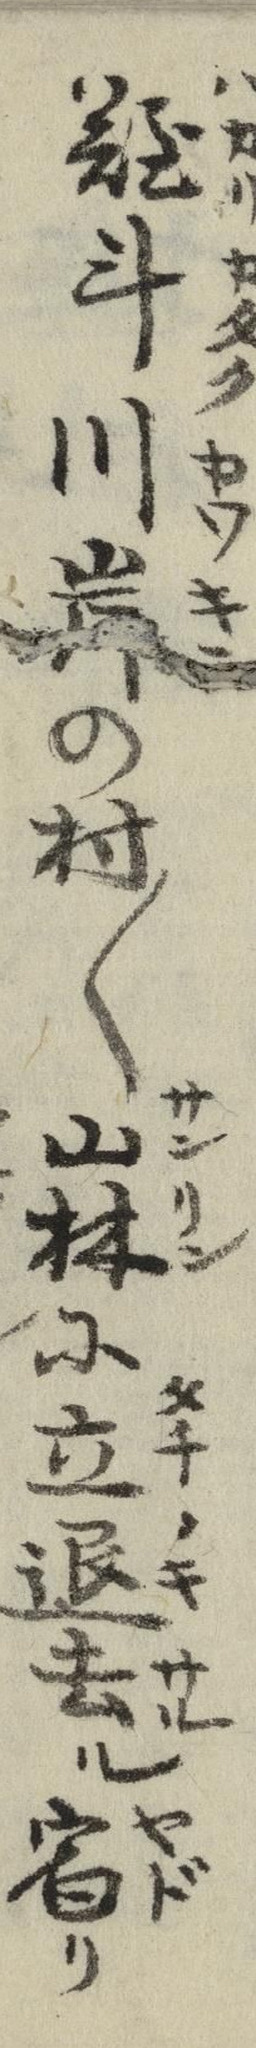難計川岸の村〳〵山林に立退去る宿り
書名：信州大地震一件之冩　丁未弘化四年三月吉日
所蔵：東京大学地震研究所図書室 Earthquake Research Institute Library, The University of Tokyo, JAPAN
